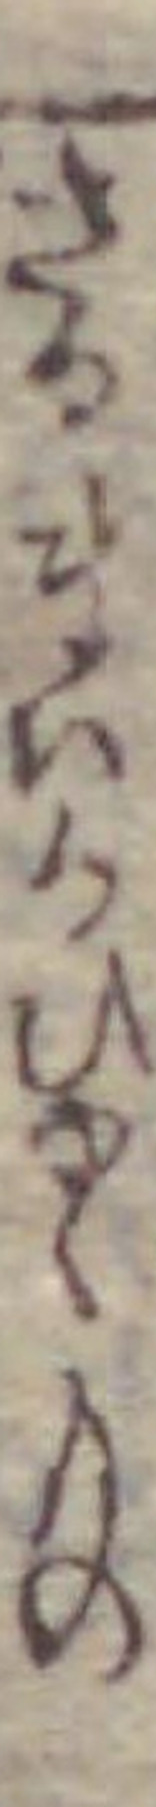さるまいかひやくもの
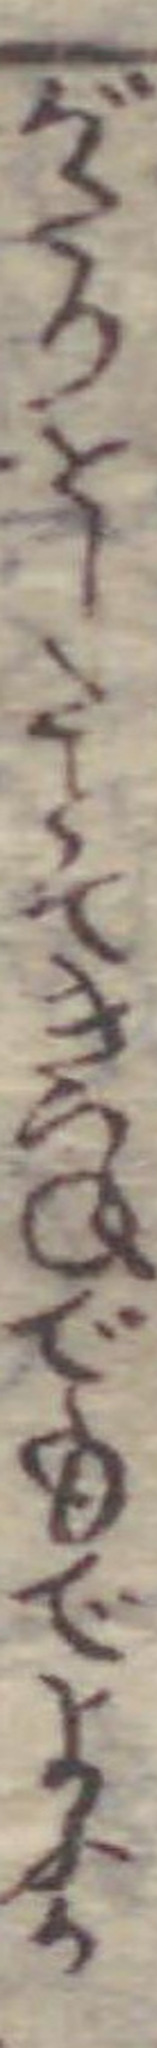がたりをしたとてきつねでもでよふか
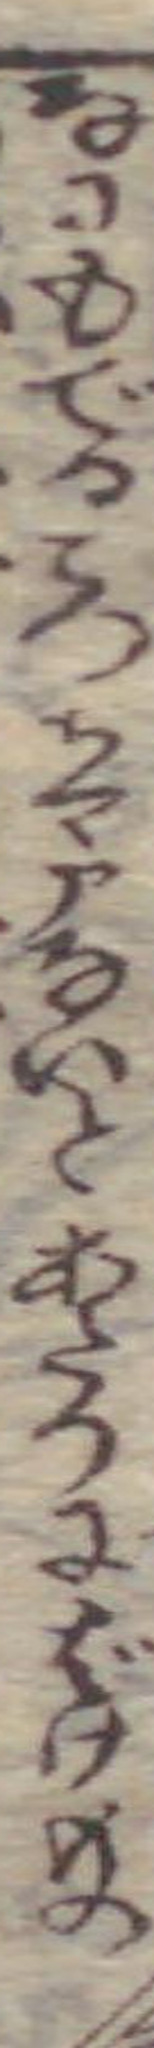なにもでるこつちやァないとあたりにばけもの
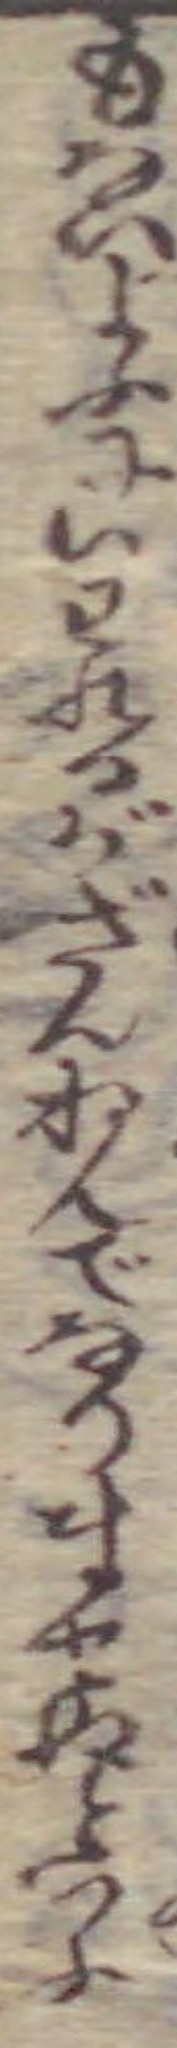もないよふにいわれるがざんねんでなりませぬといふ

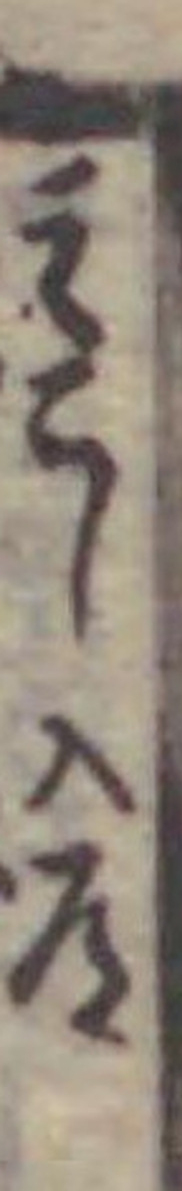みこし入道
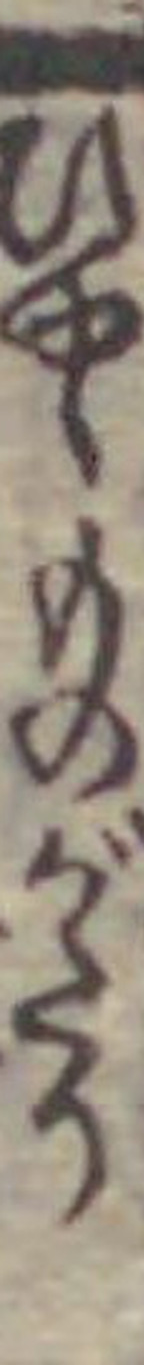ひゃくものがたり
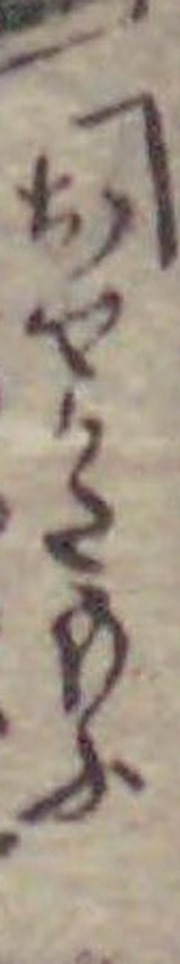〽おやかたもふ
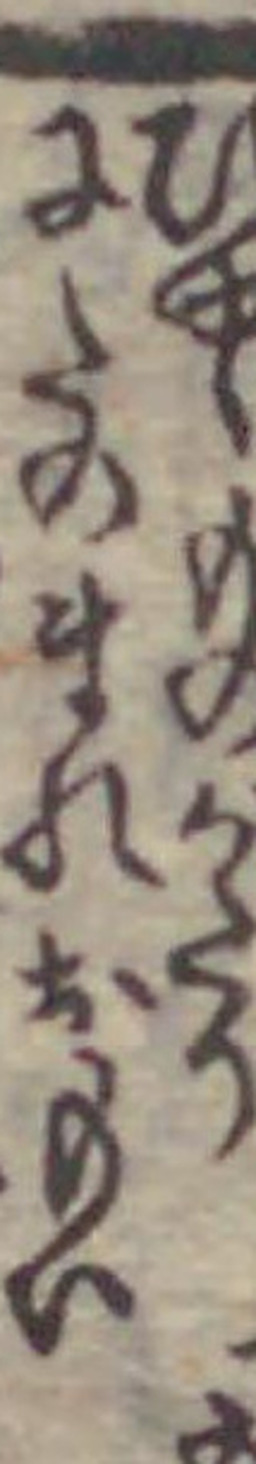にたのまれおもい
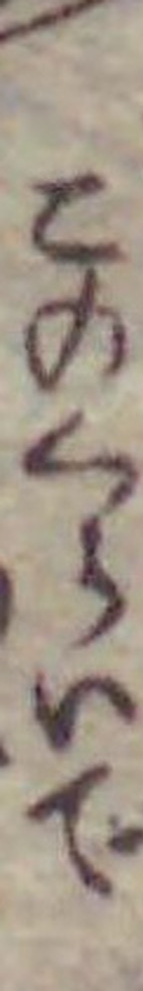このくらいで
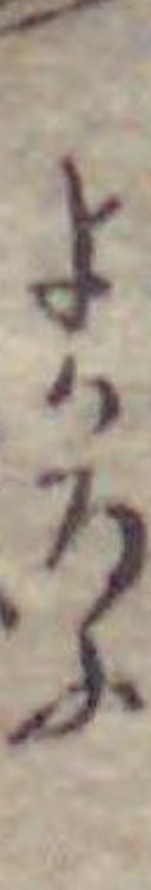よかろふ
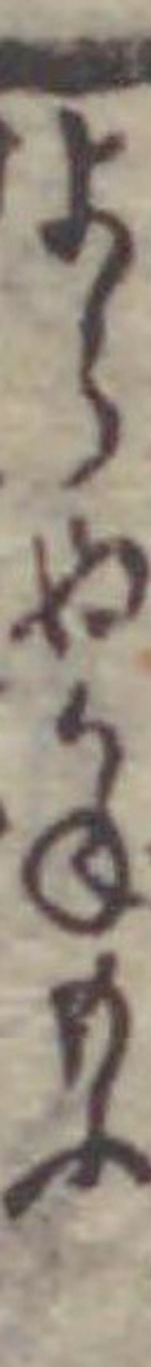よらぬかねもふ
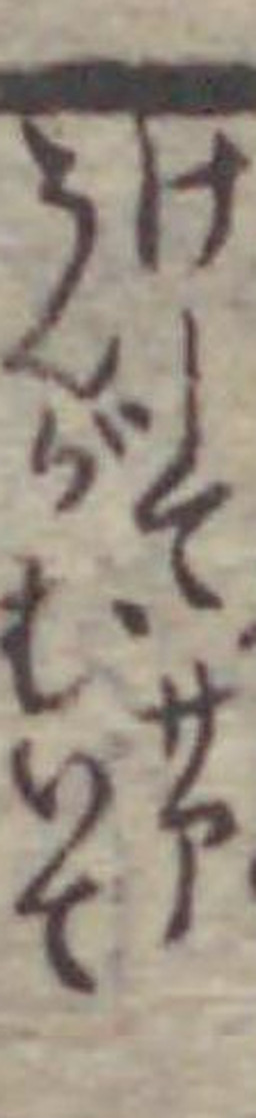うんがむいて
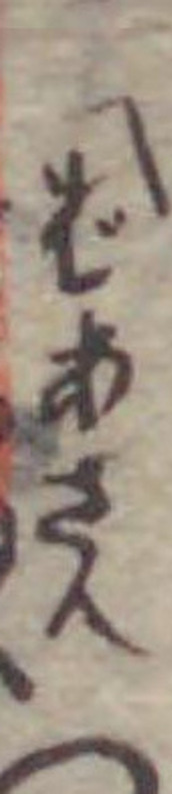〽ばあさん
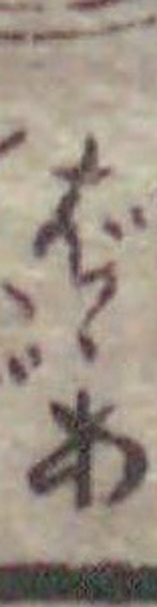ばゞあ
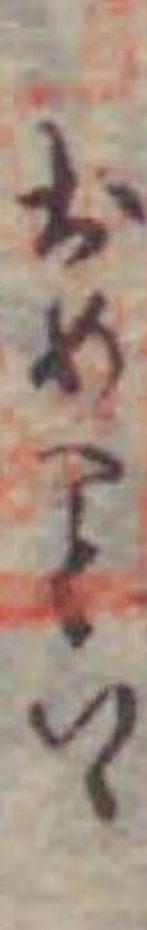おめへといゝ
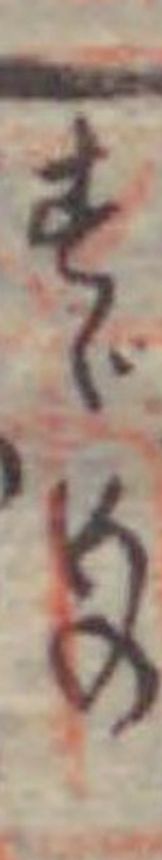すゞめの
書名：化物見世開 : 2巻
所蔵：国立国会図書館 National Diet Library, JAPAN
